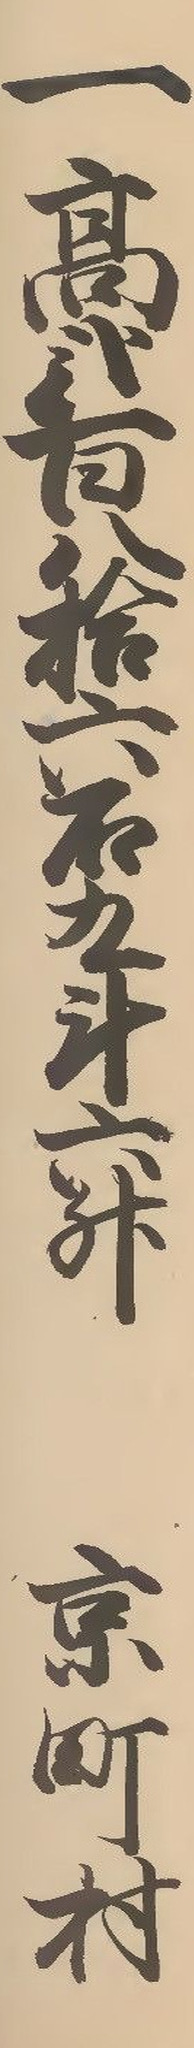一髙弐百八拾六石九斗六升京町村
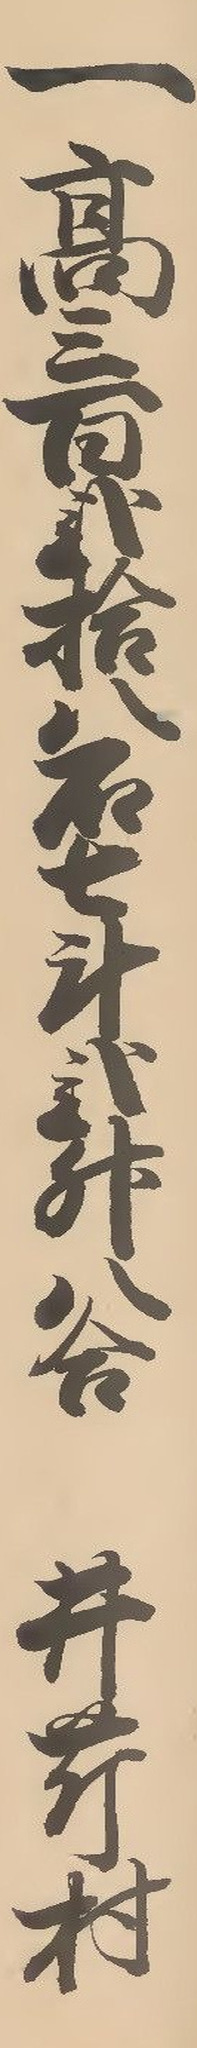一髙三百弐拾八石七斗弐升八合井芹村
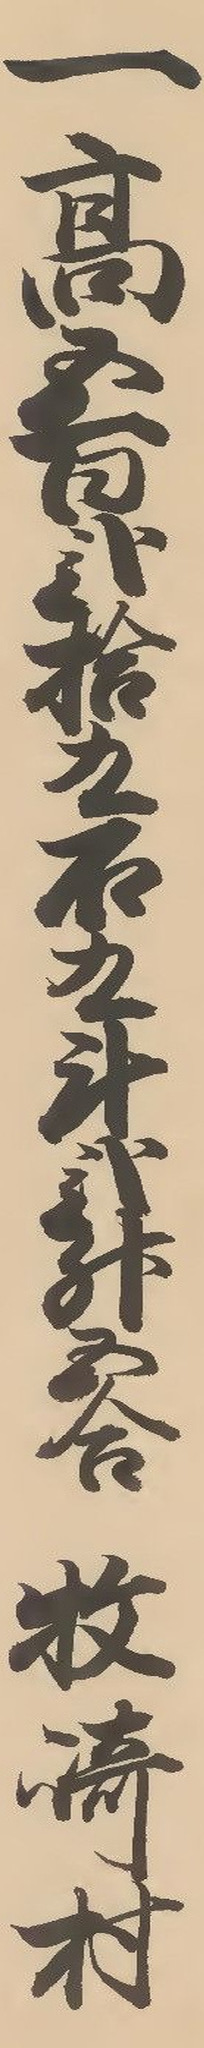一髙五百弐拾九石九斗弐升五合牧崎村
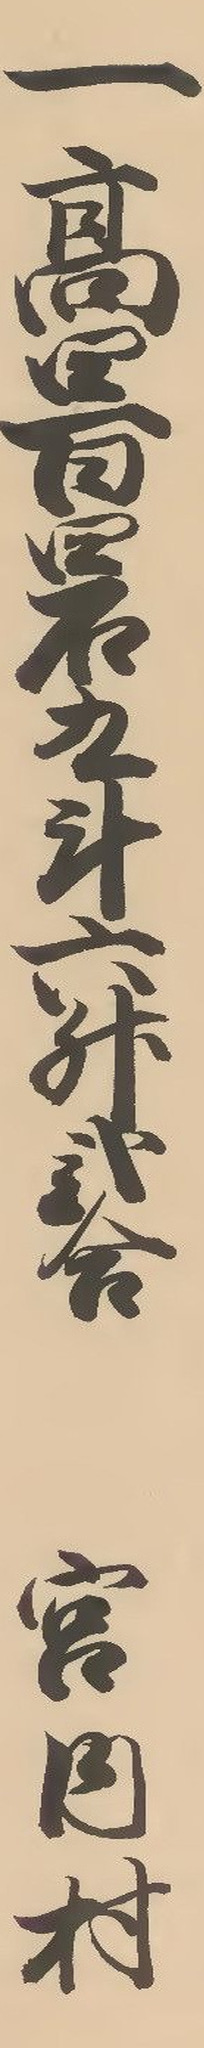一髙四百四石九斗六升弐合宮内村
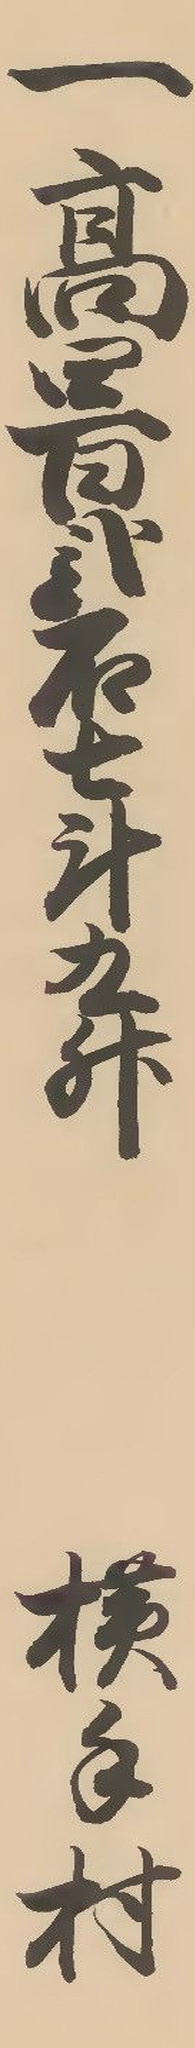一髙四百弐石七斗九升横手村

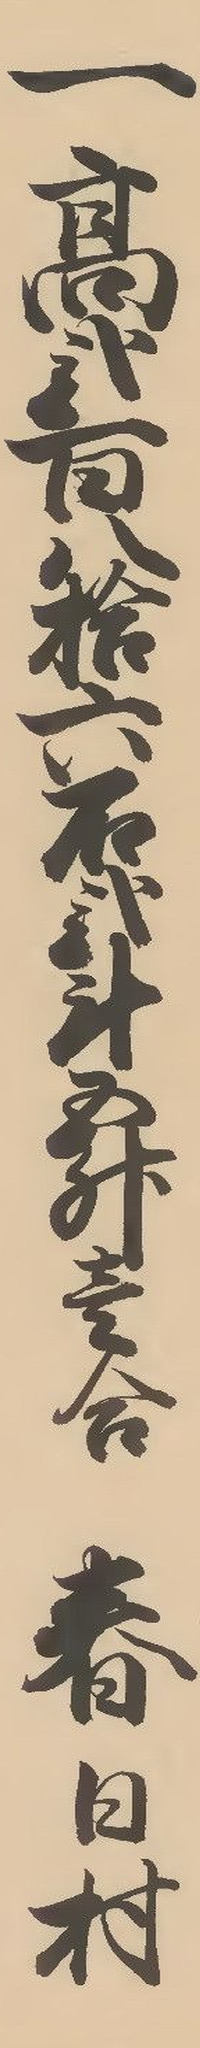一髙弐百八拾六石弐斗五升壱合春日村
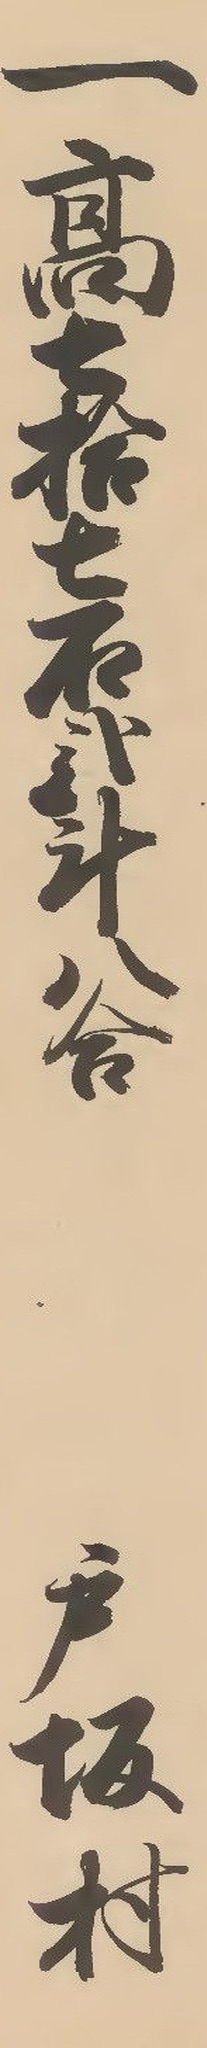一髙七拾七石弐升八合戸坂村
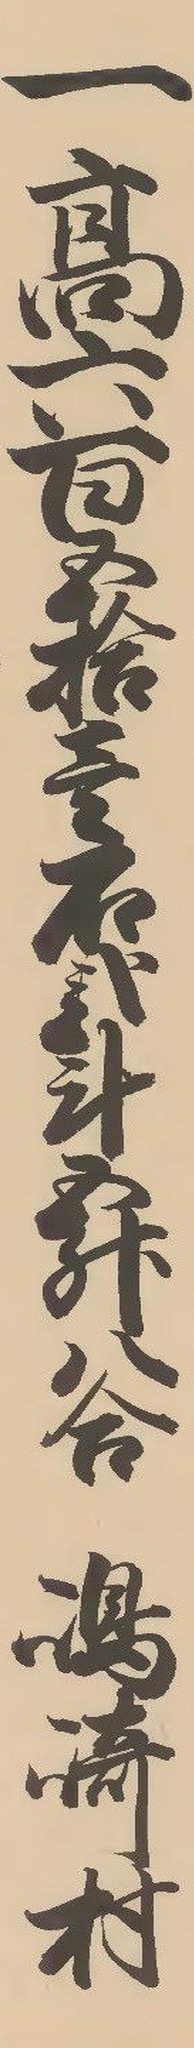一髙六百五拾壱石壱斗五升八合嶋崎村
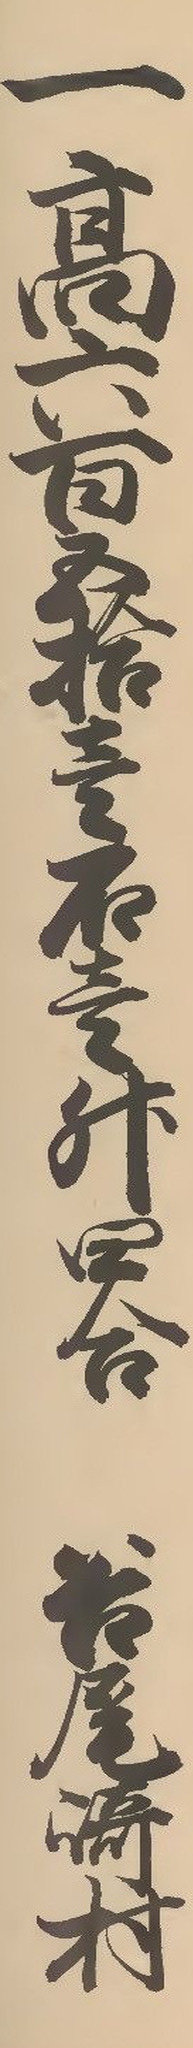一髙六百五拾壱石壱升四合谷尾崎村
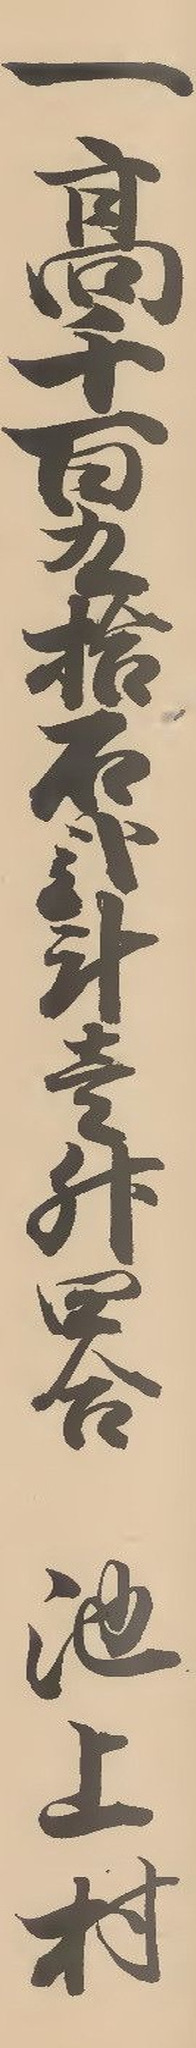一髙千百九拾石弐斗壱升四合池上村
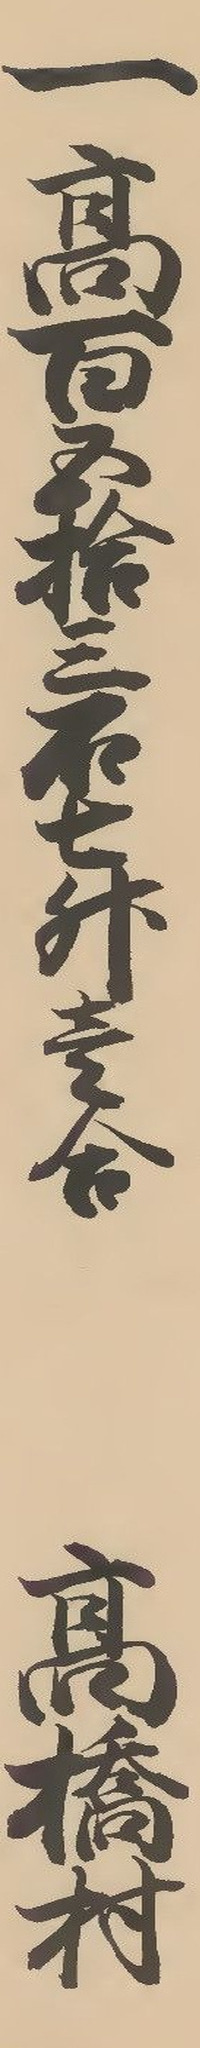一髙百五拾三石七升壱合高橋村
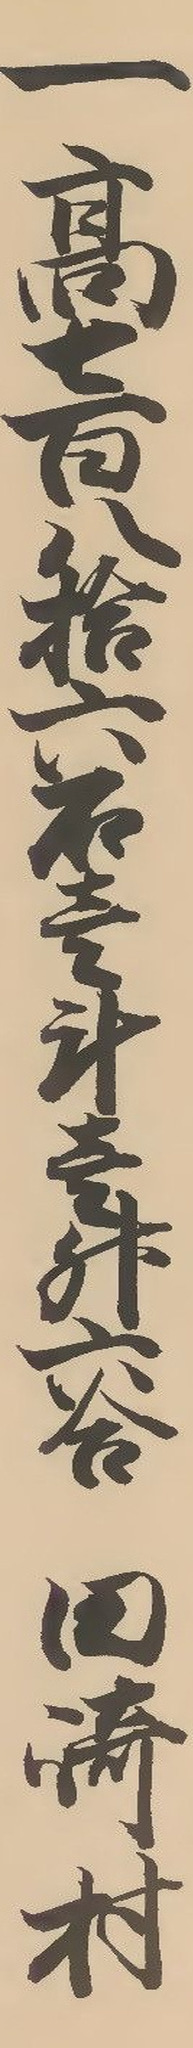一髙七百八拾六石壱斗壱升六合田崎村
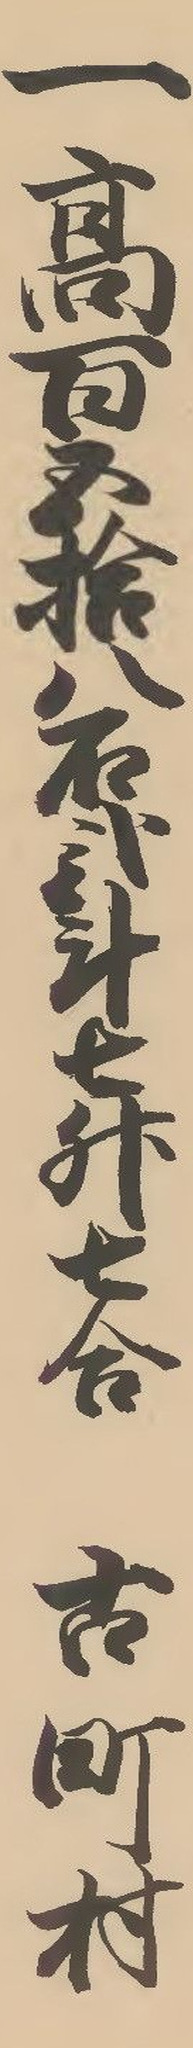一髙百五拾八石弐斗七升七合古町村

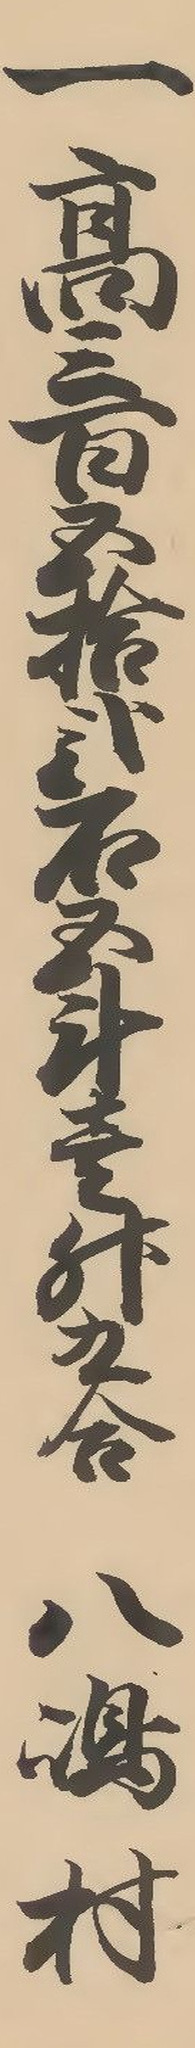一髙三百五拾弐石五斗壱升九合八嶋村
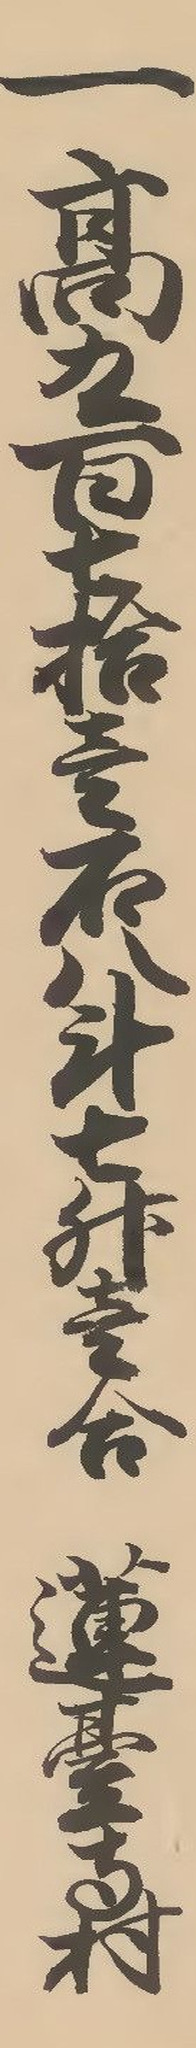一髙九百七拾壱石八斗七升壱合蓮臺寺村
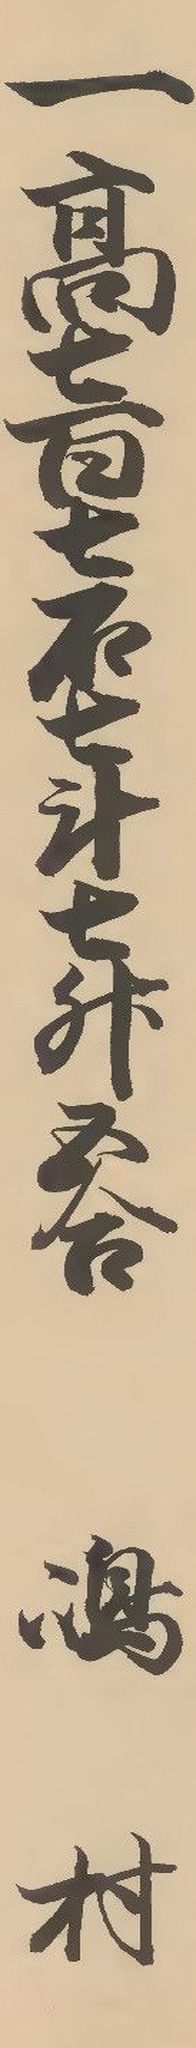一髙七百七石七斗七升五合嶋村
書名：肥後国郷帳
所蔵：国立公文書館 National Archives of Japan
